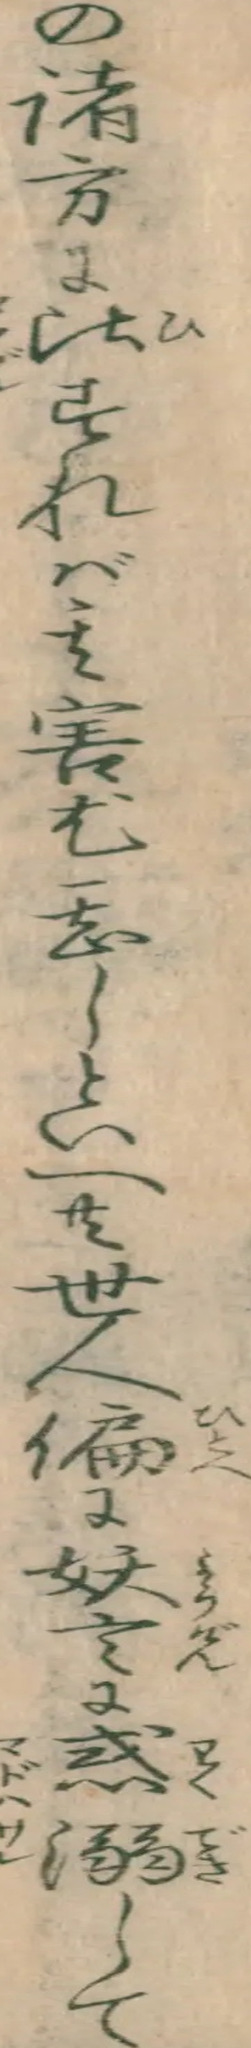の諸方に比すれば其害尤正しといへ其世人偏に妖言に惑溺して
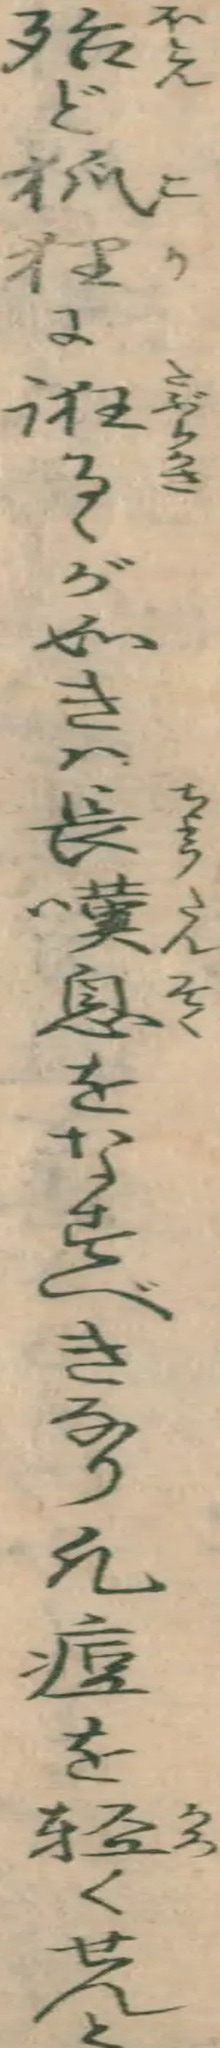殆ど狐狸に誑るゝが如きは長嘆息をなすべきなり凡痘を軽くせんと
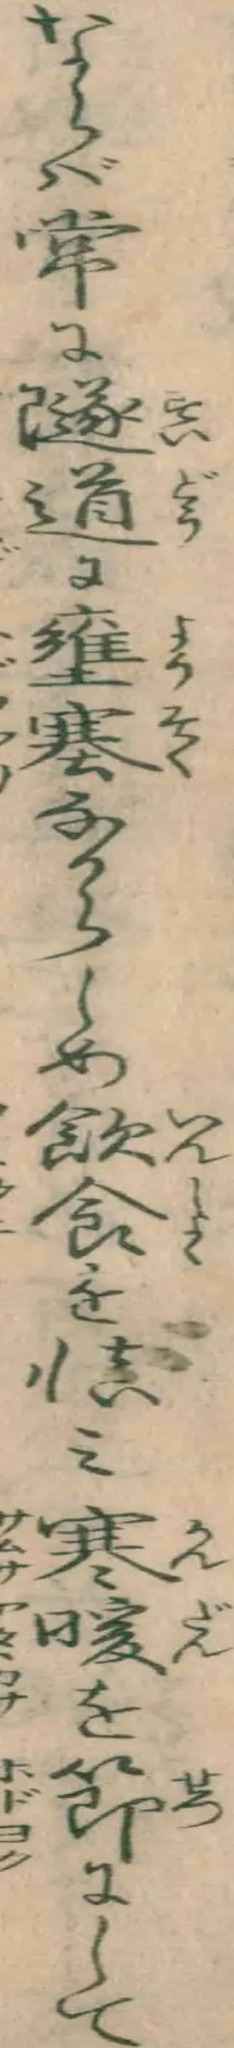ならば常に隧道に壅塞なからしめ飲食を慎み寒暖を節にして
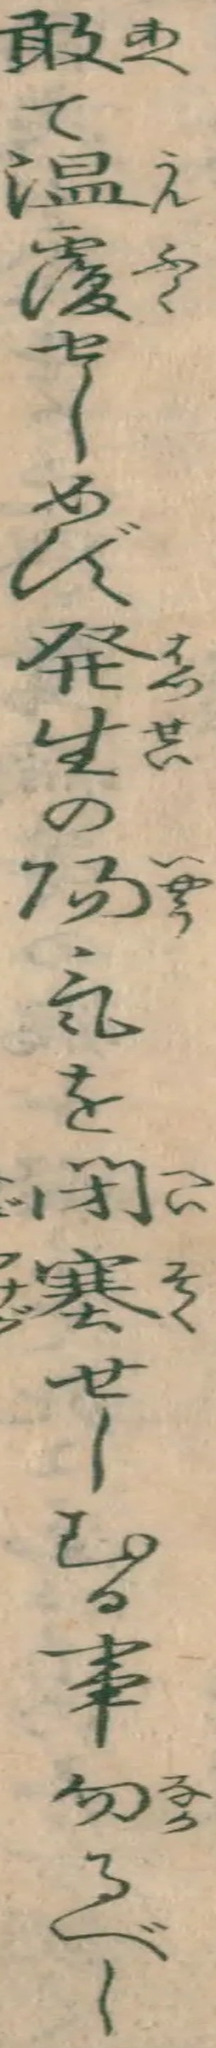敢て温覆せしめず発生の気を閉塞せしむる事勿るべし
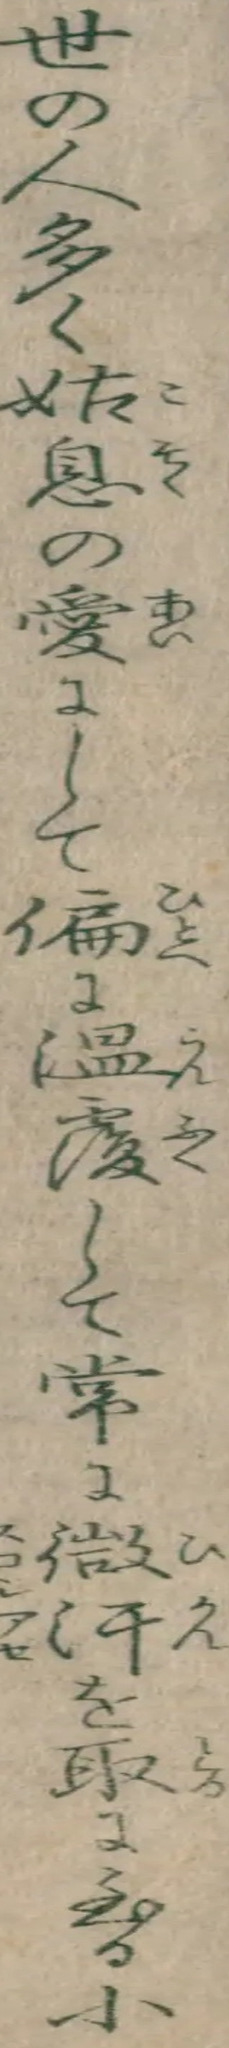世の人多く姑息の愛にして偏に温覆して常に微汗を取に至る小
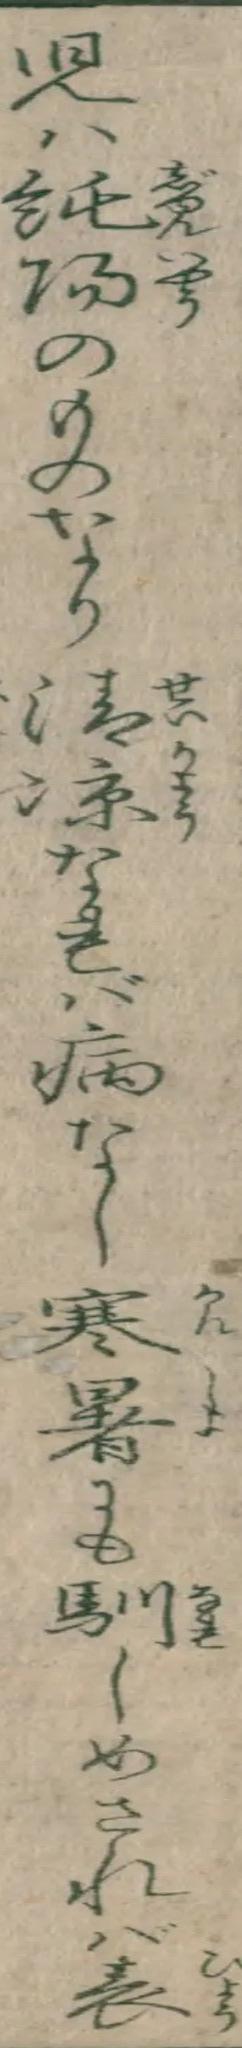児は純のものなり清涼なたれば病なし寒暑にも馴しめされば表
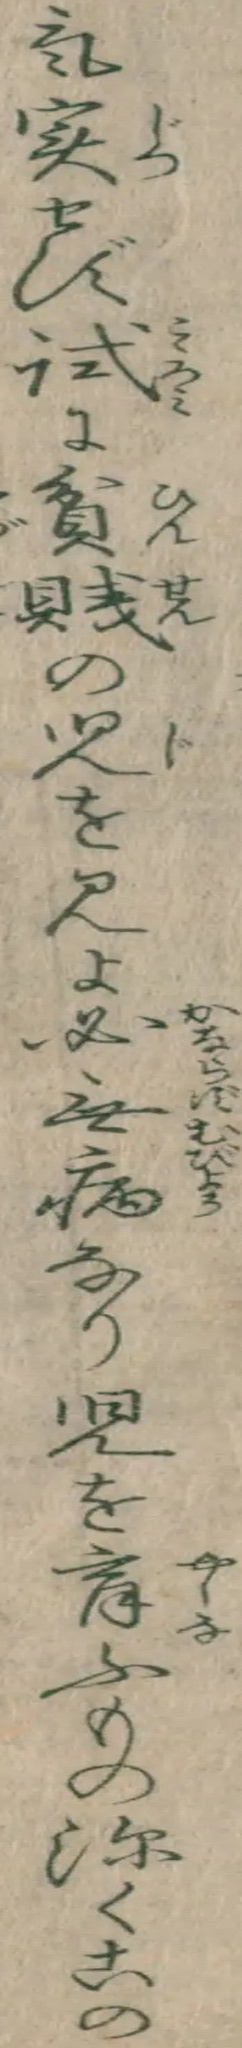気実せず試に貧賎の児を見よ必無病なり児を育ふもの深くこの
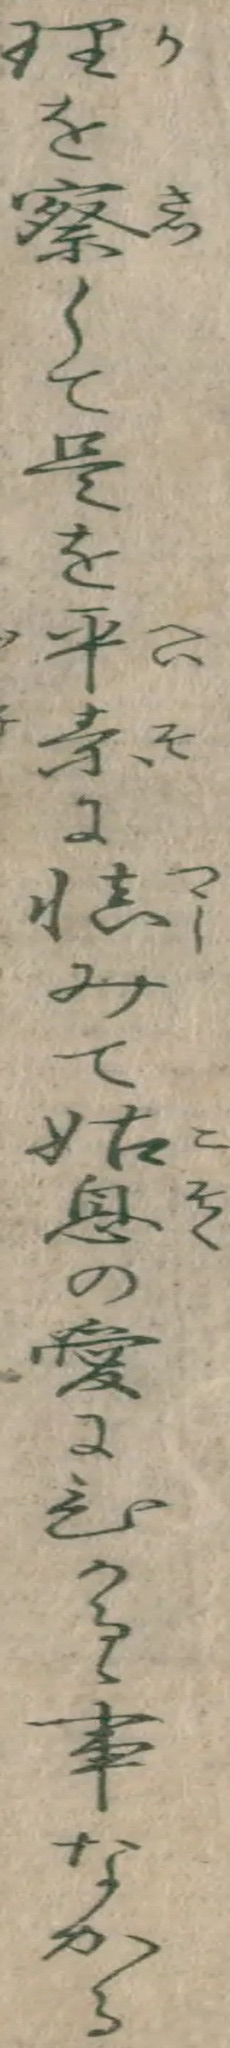理を察して是を平素に慎みて姑息の愛にひかるゝ事なかる
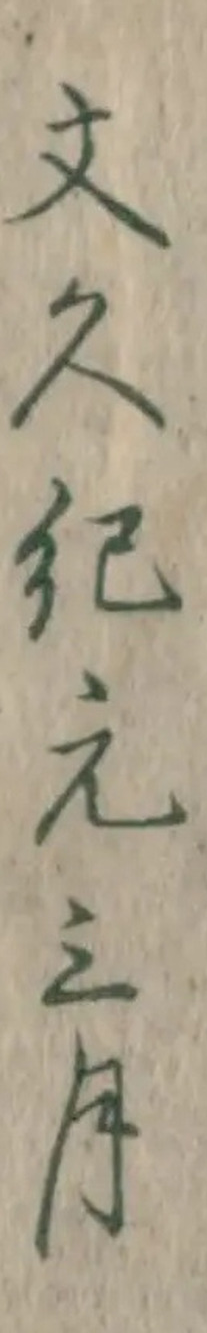文久紀元三月
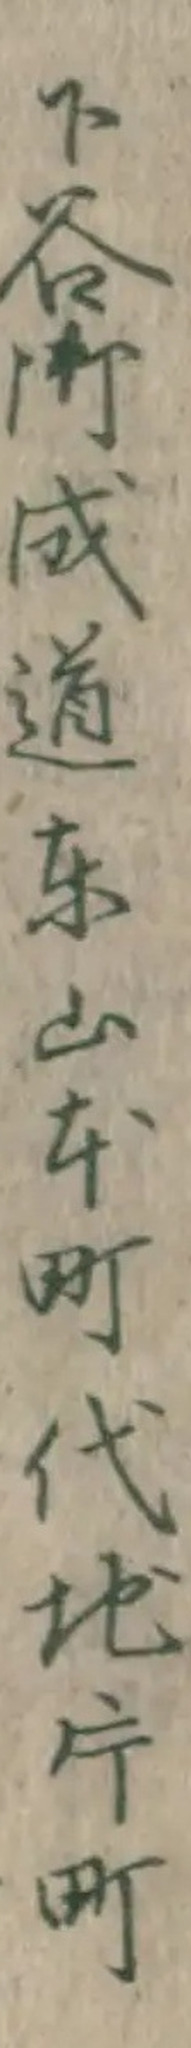下谷成通東山本町代地片町
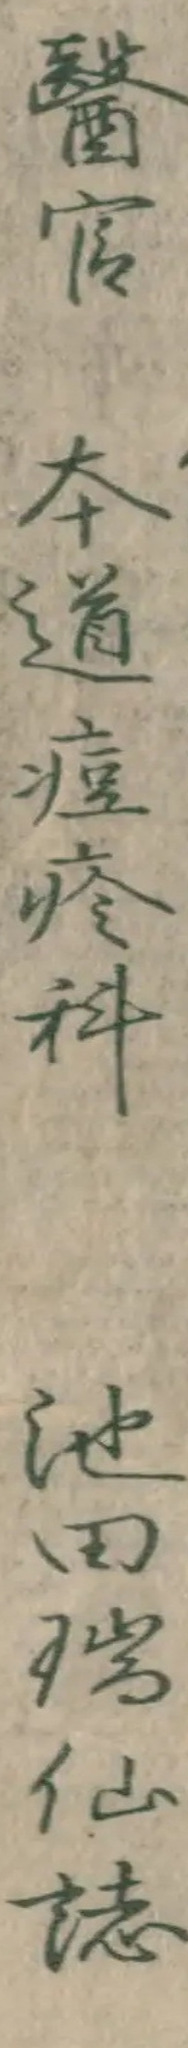醫官本道痘疹科池田鍋仙誌
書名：牛痘辨非
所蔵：国立国会図書館 National Diet Library, JAPAN
